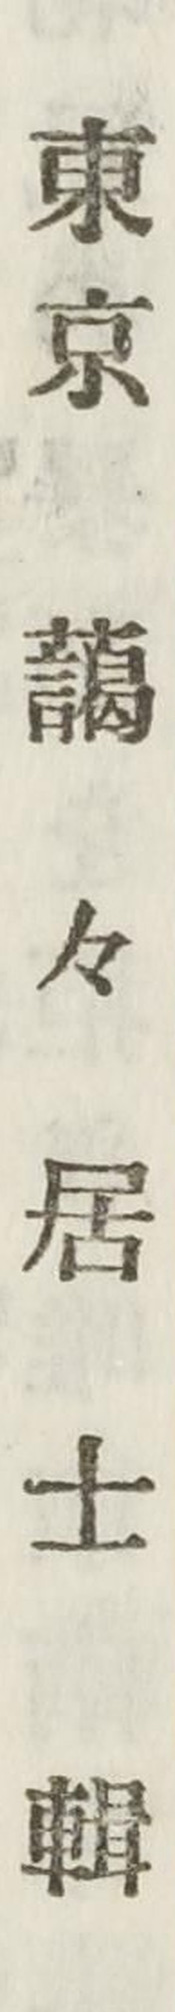東京藹々居士輯
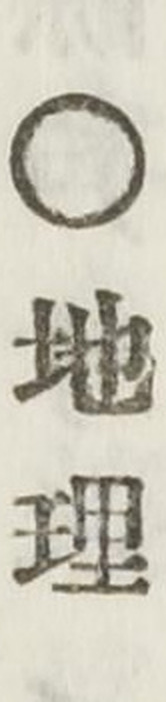〇地理
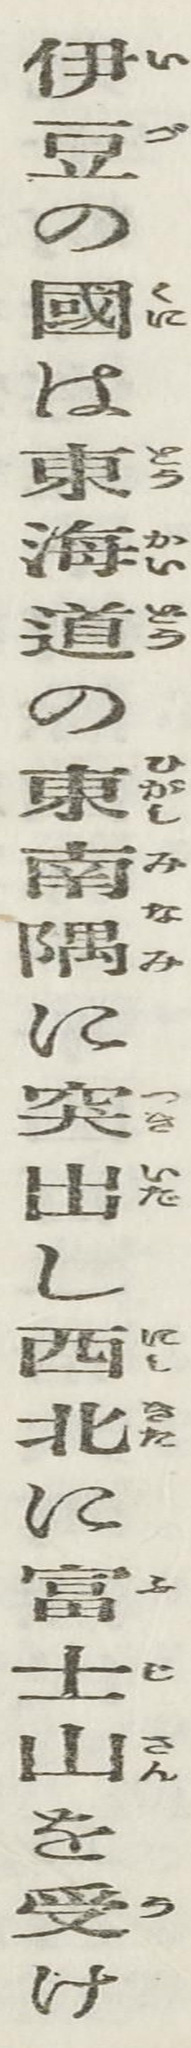伊豆の国は東海道の東南隅に突出し西北に富士山を受け
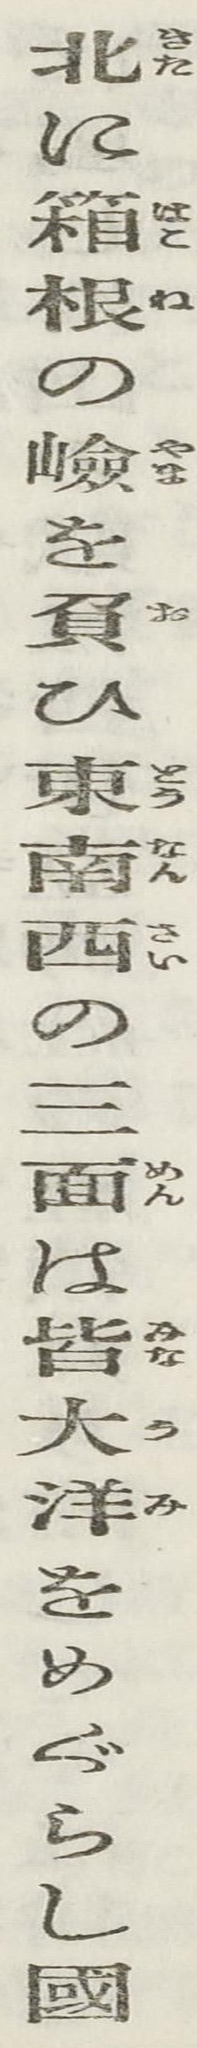北に箱根の嶮を負ひ東南西の三面は皆大洋をめぐらし国
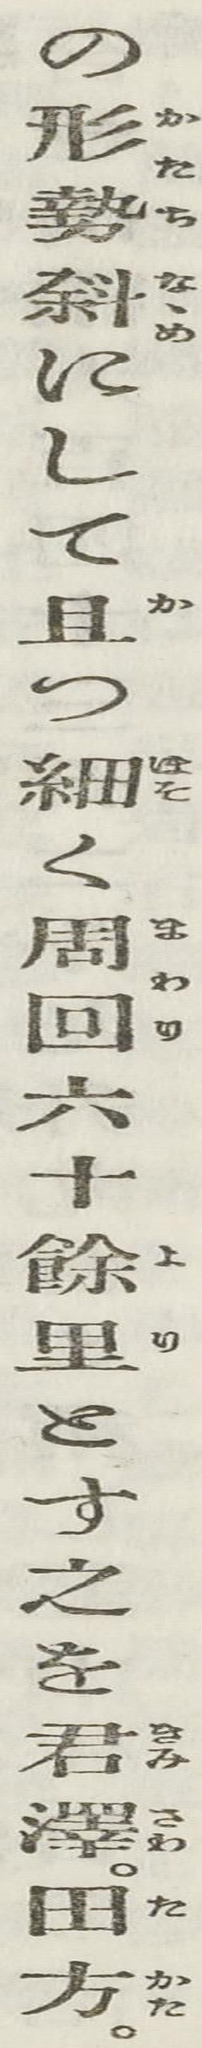の形勢斜にして且つ細く周回六十余里とす之を君澤。田方
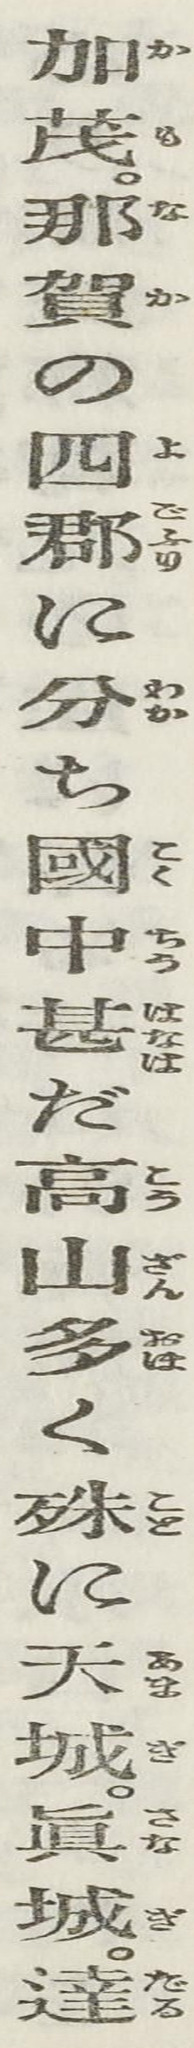加茂。那賀の四郡に分ち国中甚だ高山多く殊に天城。真城。達
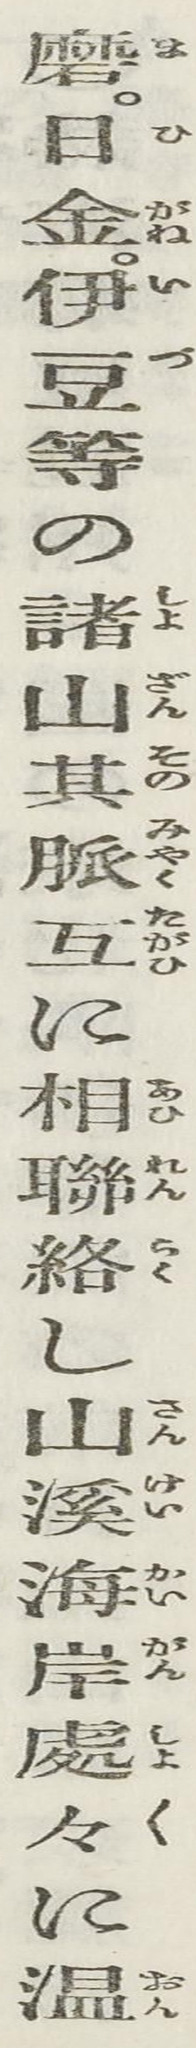磨。日金伊豆等の諸山其脈互に相連絡し山渓海岸処々に温
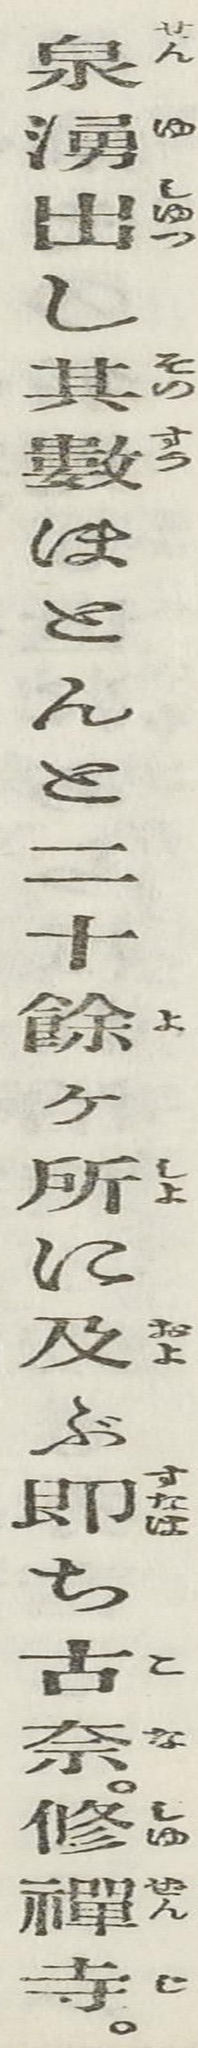泉湧出し其数ほとんと二十余ヶ所に及ぶ即ち古奈。修禅寺。
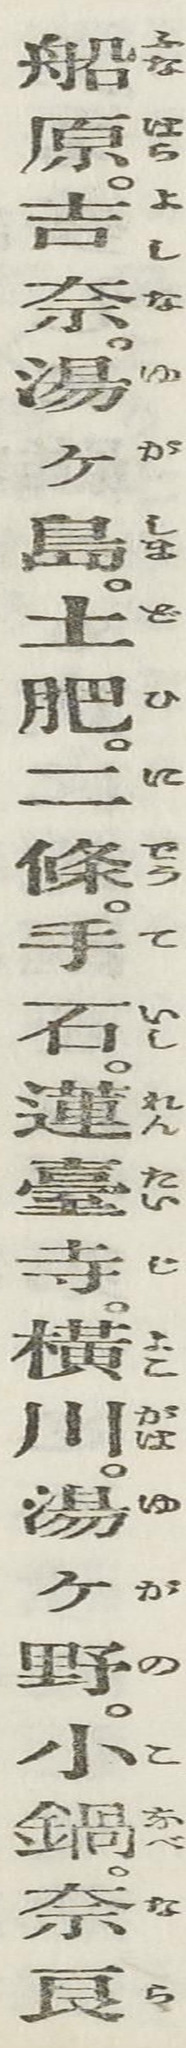船原。吉奈。湯ヶ島。土肥。二條。手石。蓮臺寺。横川。湯ヶ野。小鍋。奈良
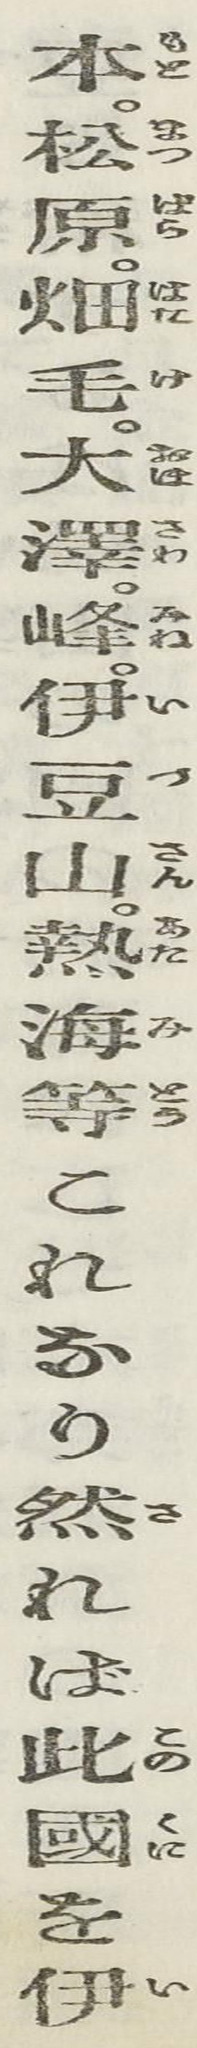本。松原。畑毛。大澤。峰。伊豆山。熱海等これなり然れば此國を伊

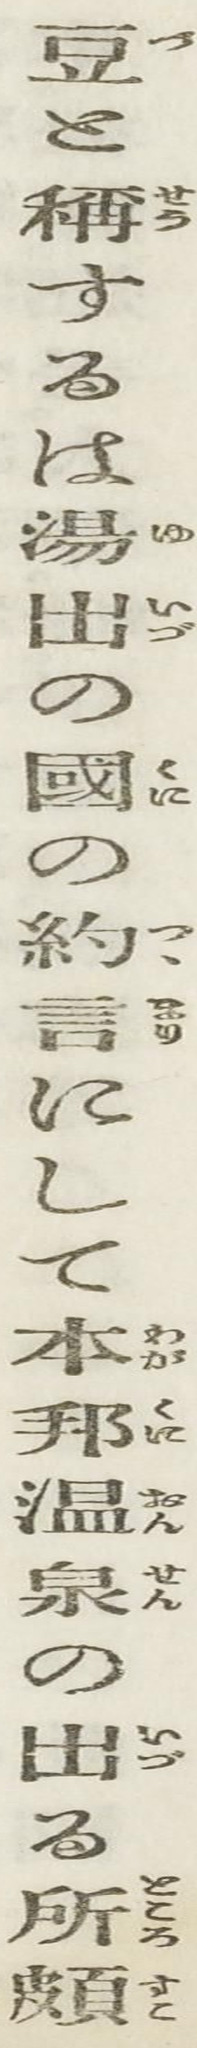豆と称するは湯出の国の約言にして本邦温泉の出る所頗
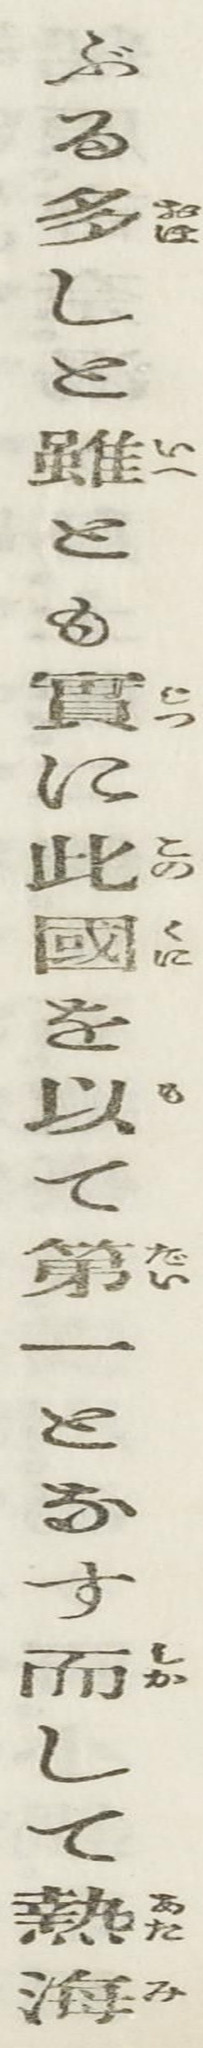ぶる多しと雖とも実に此国を以て第一となす而して熱海
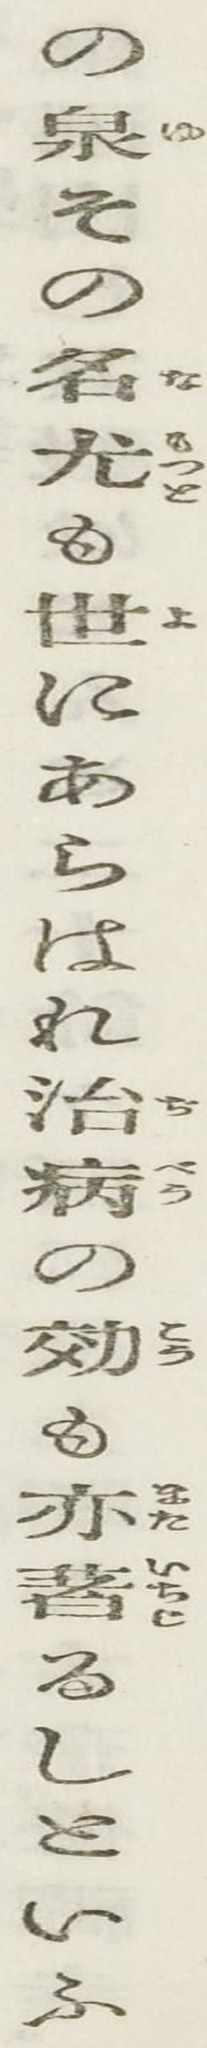の泉その名尤も世にあらはれ持病の効も亦著るしといふ
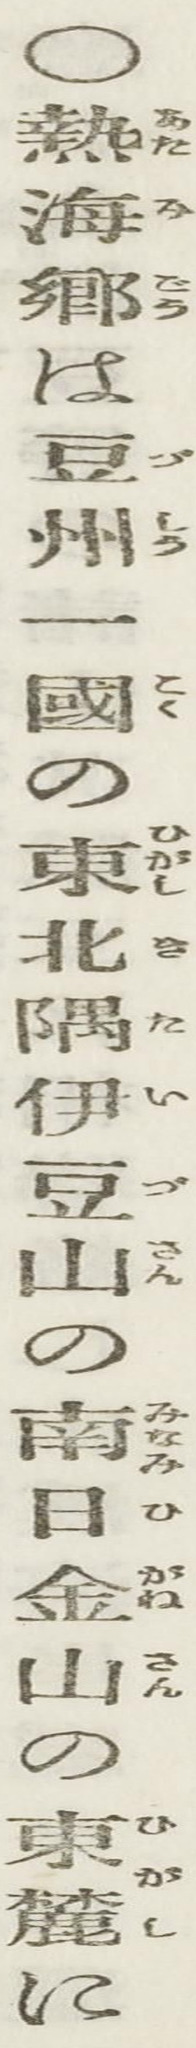〇熱海郷は豆州一国の東北隅伊豆山の南日金山の東麓に
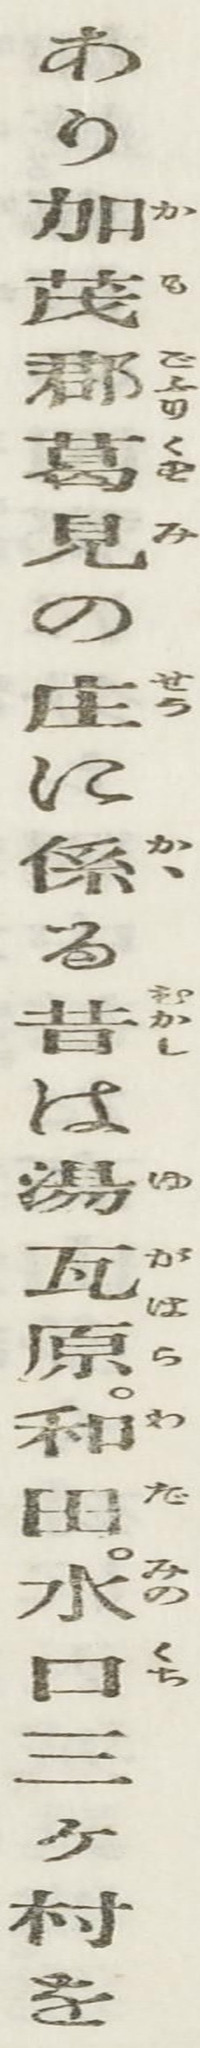あり加茂郡葛見の庄に係る昔は湯河原。和田。水口三ケ村を
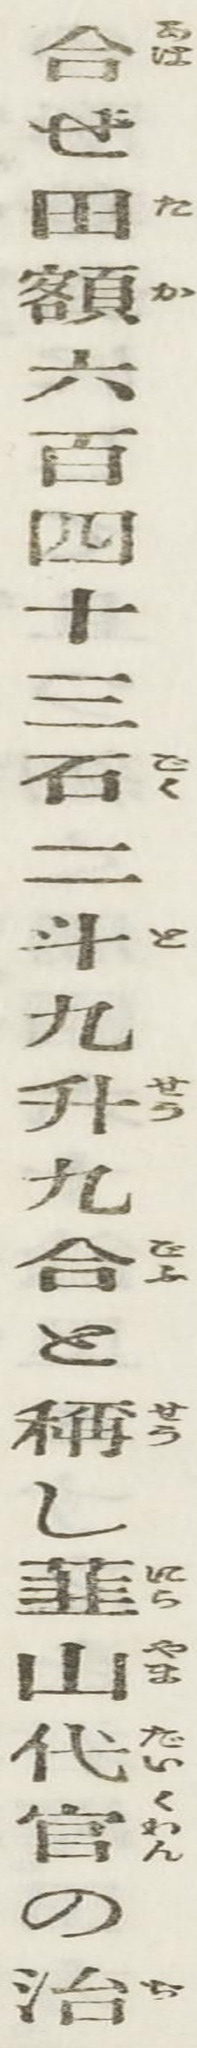合せ田額六百四十三石二斗九升九合と称し韮山代官の治
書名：熱海獨案内　全
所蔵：東京大学地震研究所図書室 Earthquake Research Institute Library, The University of Tokyo, JAPAN
